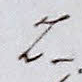2
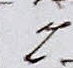2
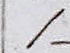1
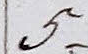5
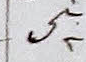5
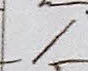1
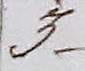3
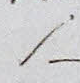1
